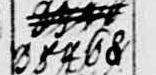35468
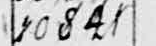10841
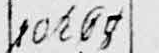10265
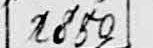2859
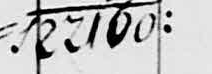122160
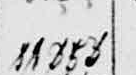11353
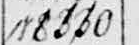18330
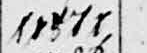11571
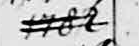1782
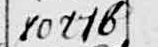10276
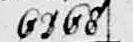6368
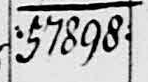57898
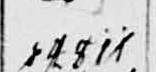14811
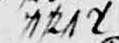7212
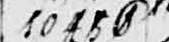10456
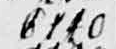6140
